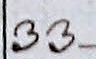33
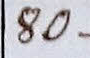80
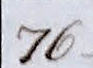76
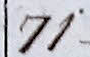71
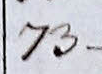73
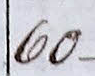60
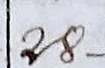28
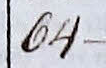64
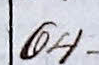64
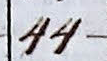44
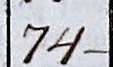74
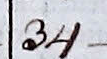34
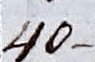40
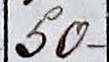50
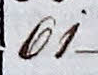61
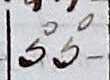55
